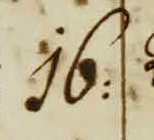16:
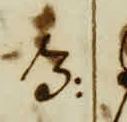3:
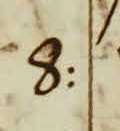8:
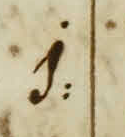1:
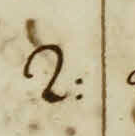2:
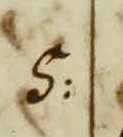5:
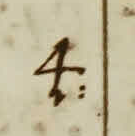4:
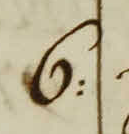6:
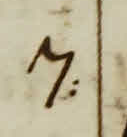7:
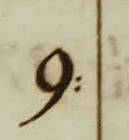9:
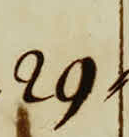29
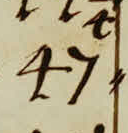47
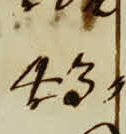43
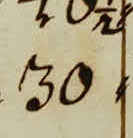30
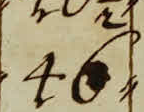46
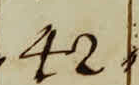42
